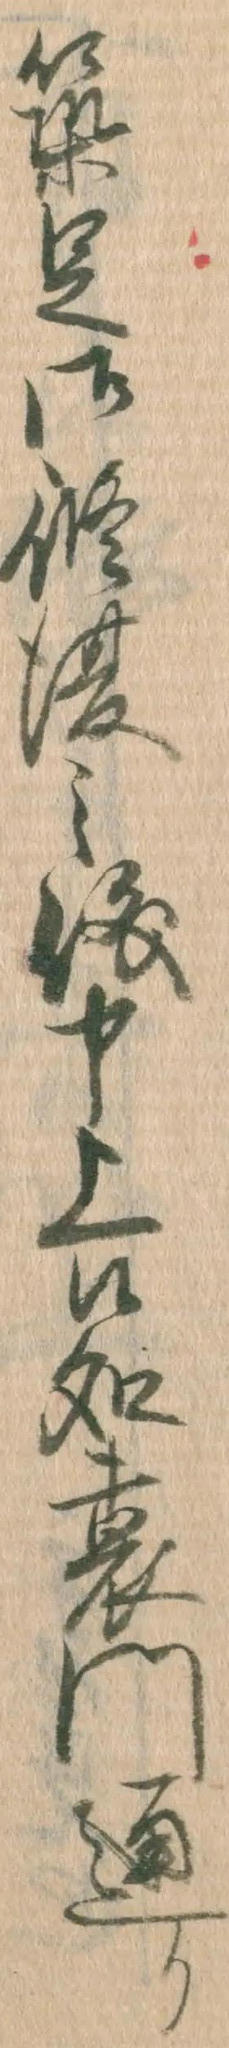築足御修復之儀申上候処裏門通り
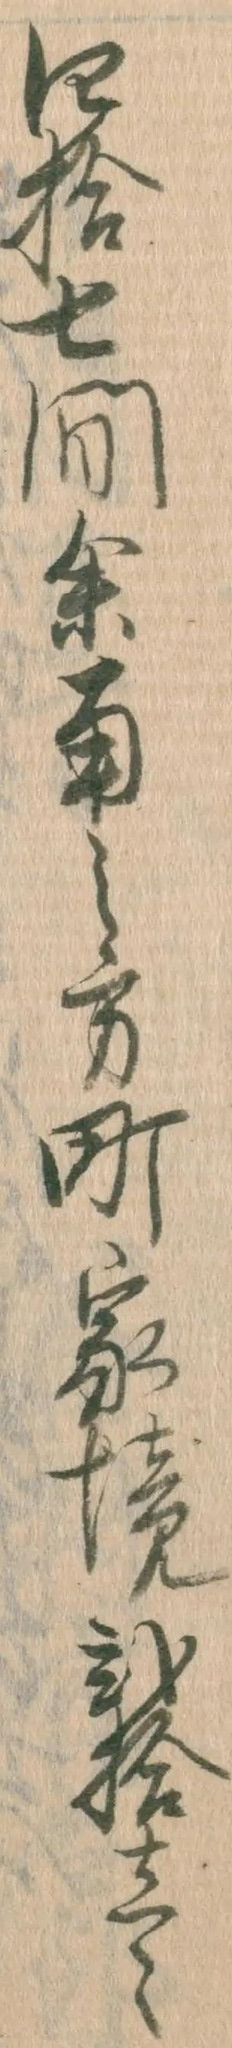四拾七間余南之方町家境弐拾壱
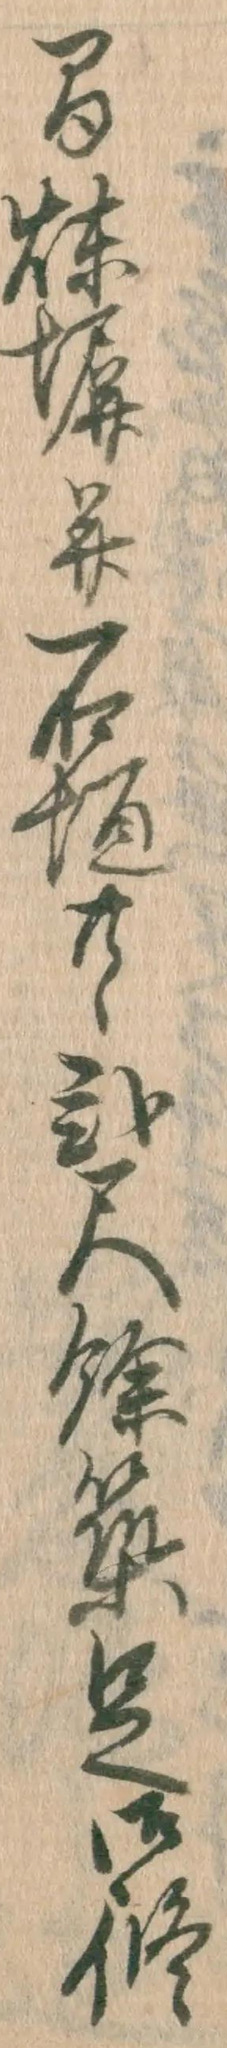間煉塀幷石垣共〻弐尺余築足御修
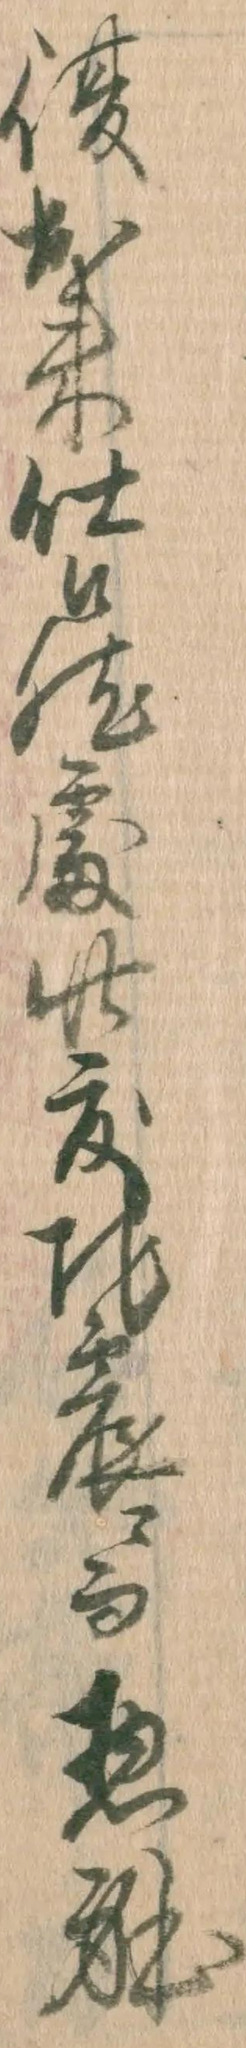復近来仕候然処此度地震ニて惣体
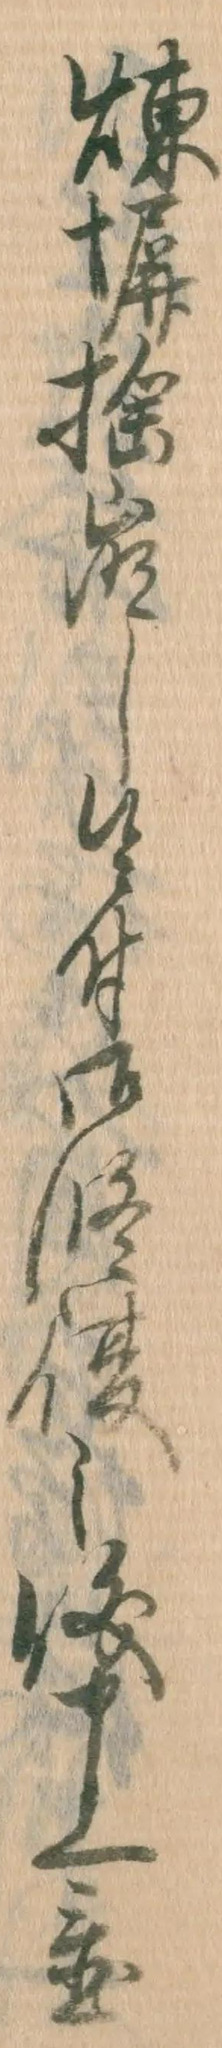煉塀揺崩し候ニ付御修復之儀申上置
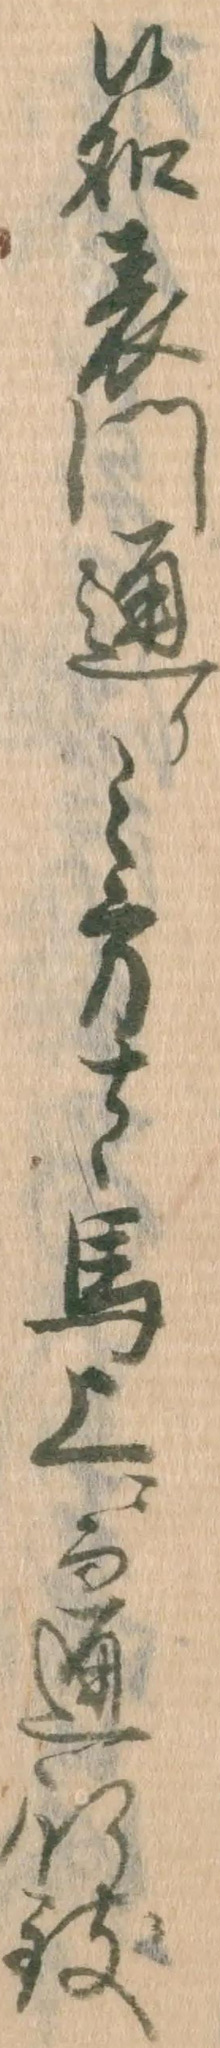候処表門通り之方は馬上ニて通行致
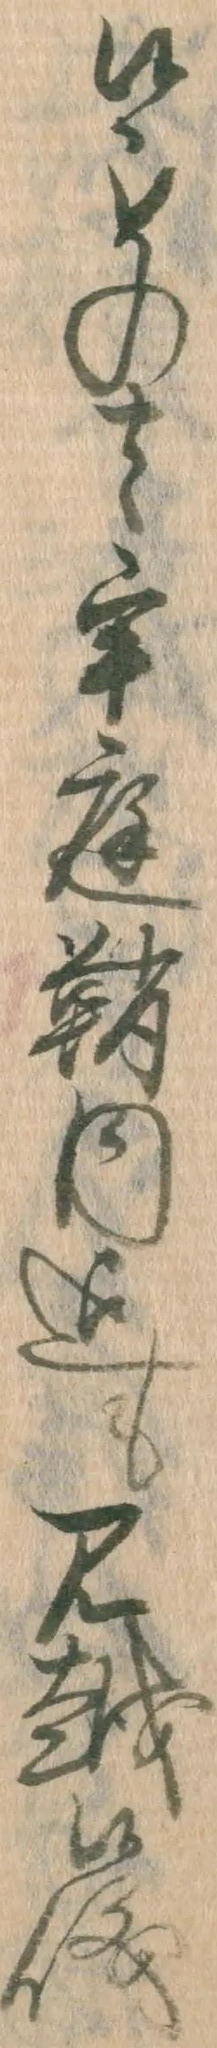候もの共牢庭鞘内迄も見越候儀
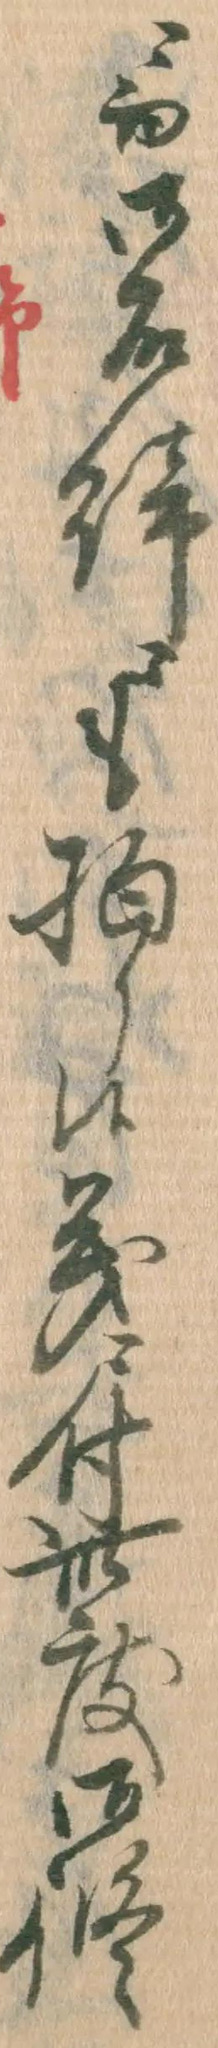ニて御取締ニも拘り候義ニ付此度御修
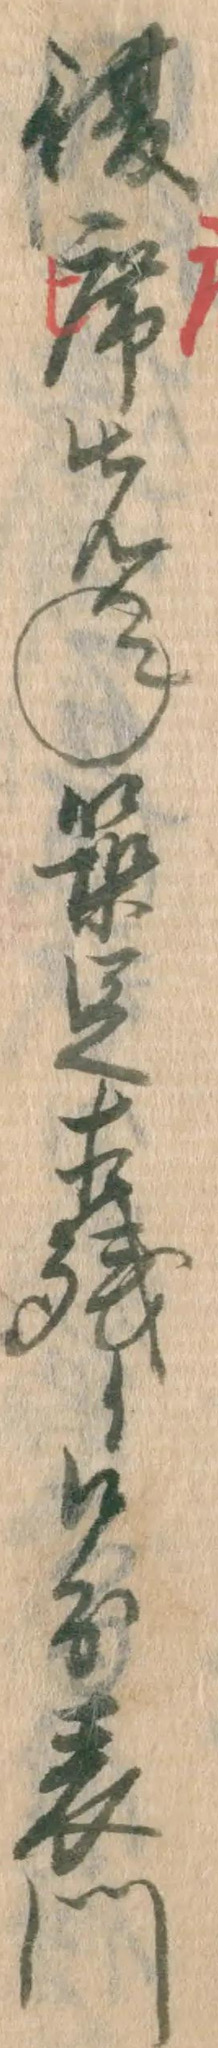復序先年築足相残候分表門
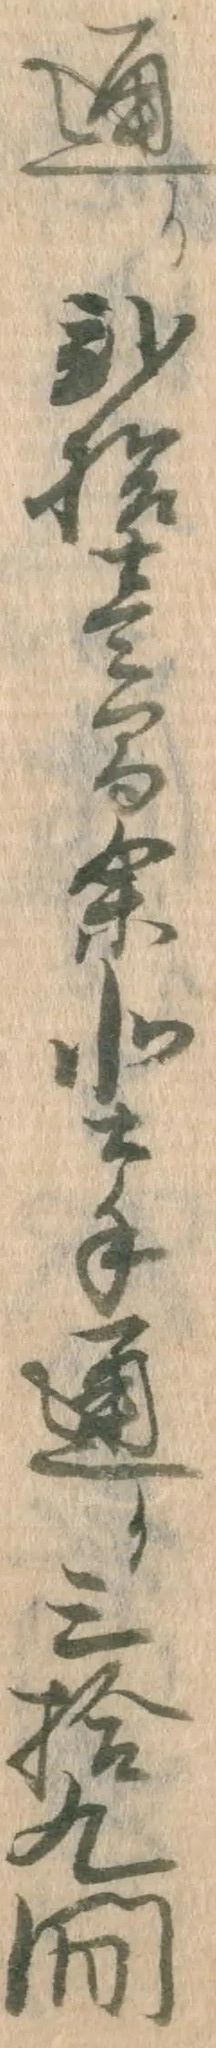通り弐拾壱間余北土手通り三拾九間

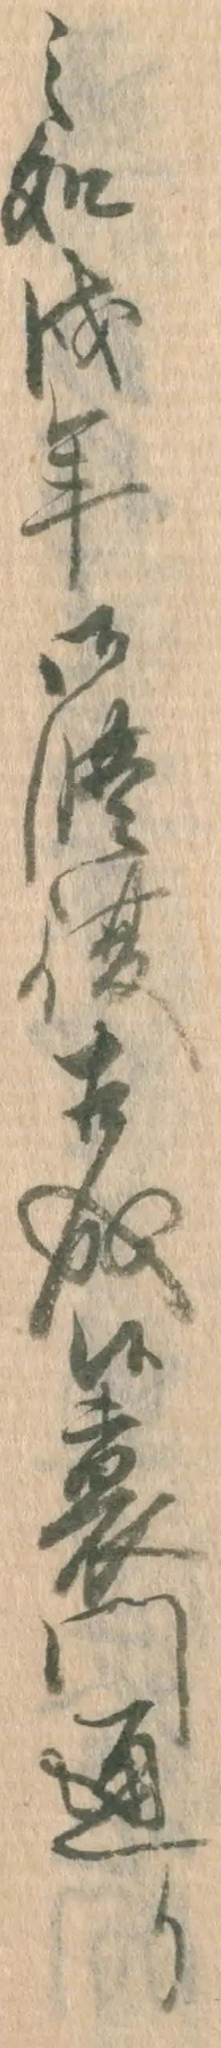之処戌年御修復相成候裏門通り
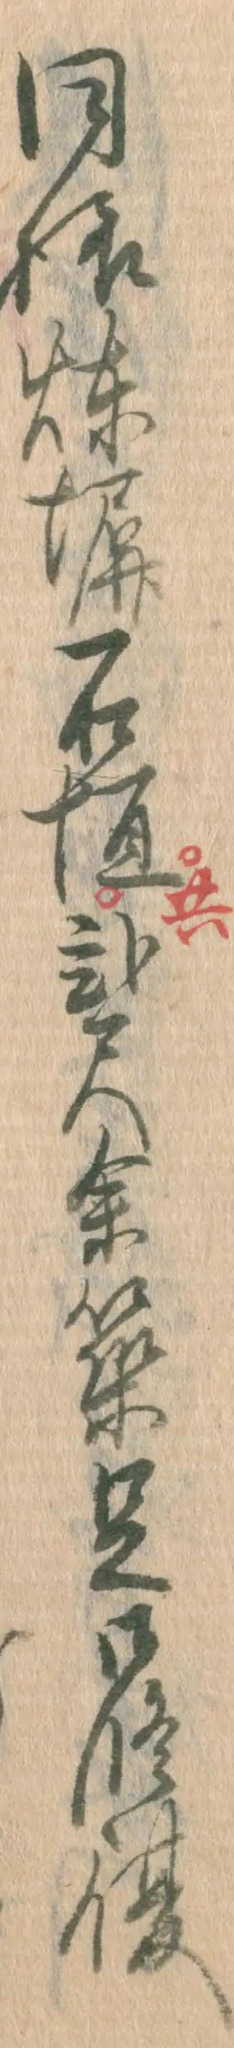同様煉塀石垣共弐尺余築足御修復
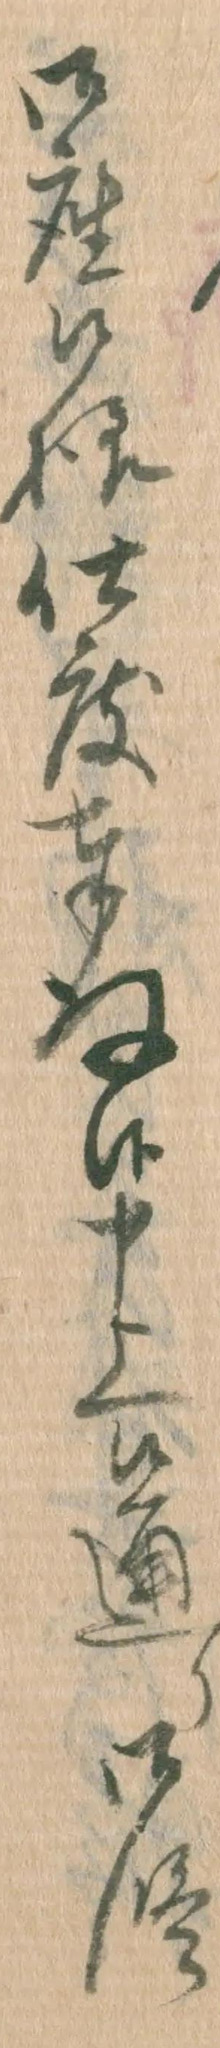御座候様仕度奉存候申上候通り御修
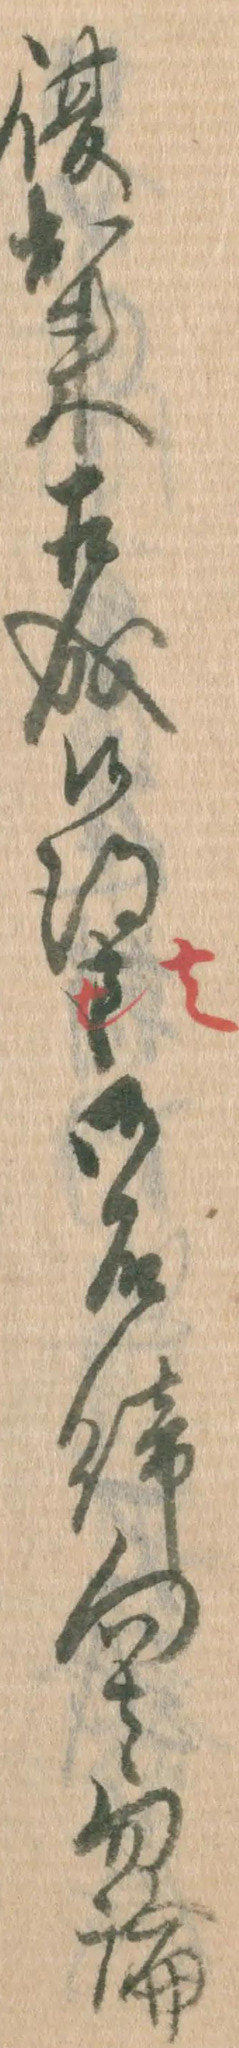復出来相成候得は御取締向は勿論
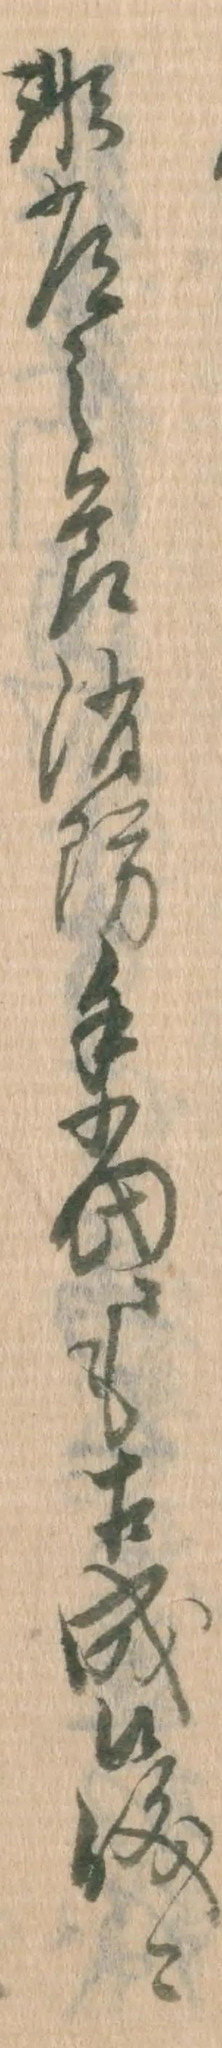非常之節消防手当ニも相成候儀ニ
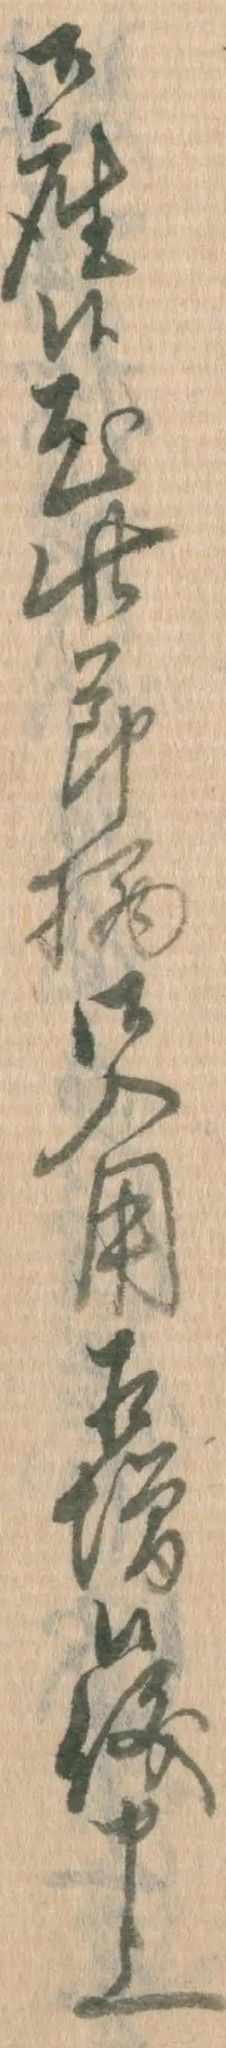御座候尤此節柄御入用相増候儀申上
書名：七十冊物類集 71巻. [44] 四十三 牢屋敷御普請御修覆地震ニ付骨折候牢屋掛御褒美之部
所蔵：国立国会図書館 National Diet Library, JAPAN
